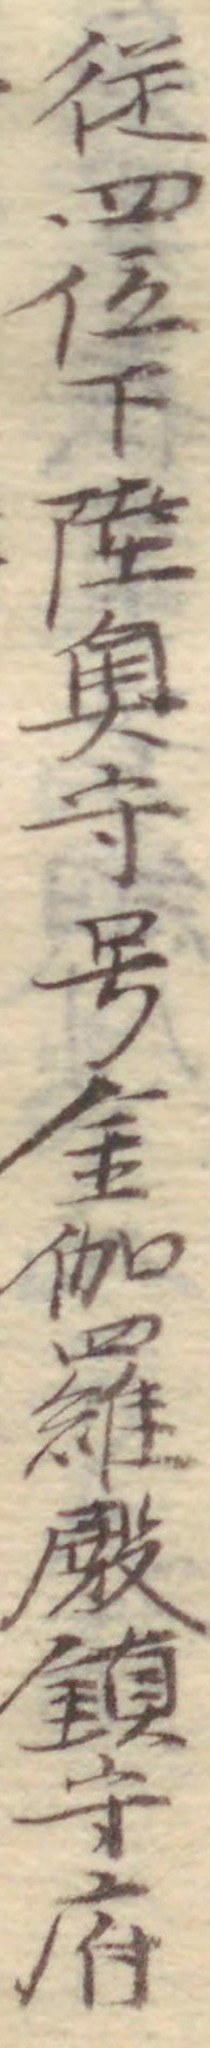従四位下陸奥守号金伽羅殿鎮守府
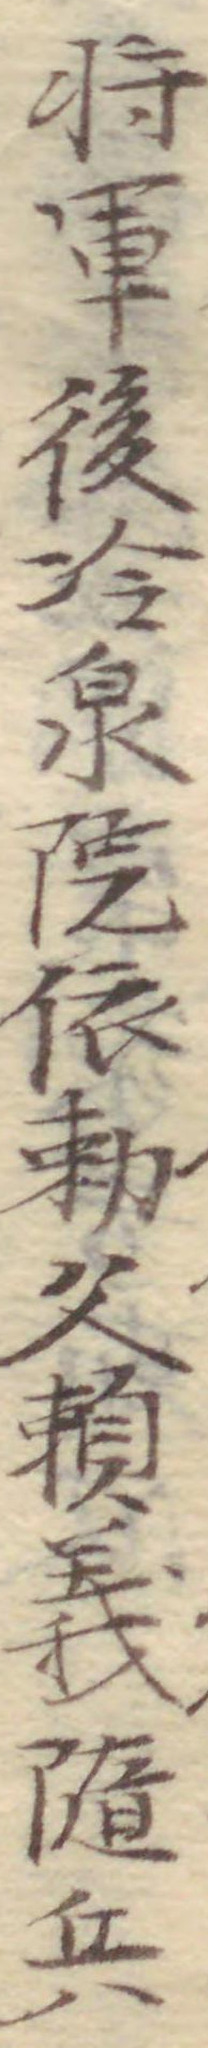将軍後冷泉院依勅父頼義隨兵
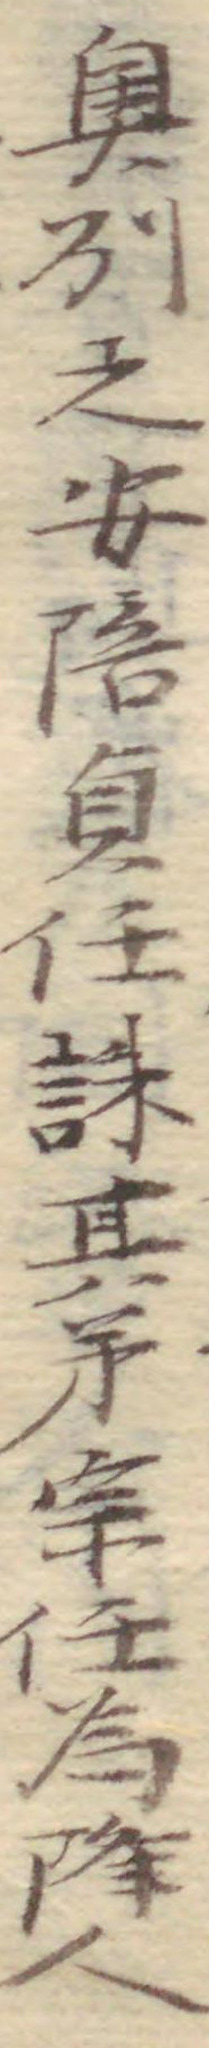奥州之安陪貞任誅其弟宗任為降人
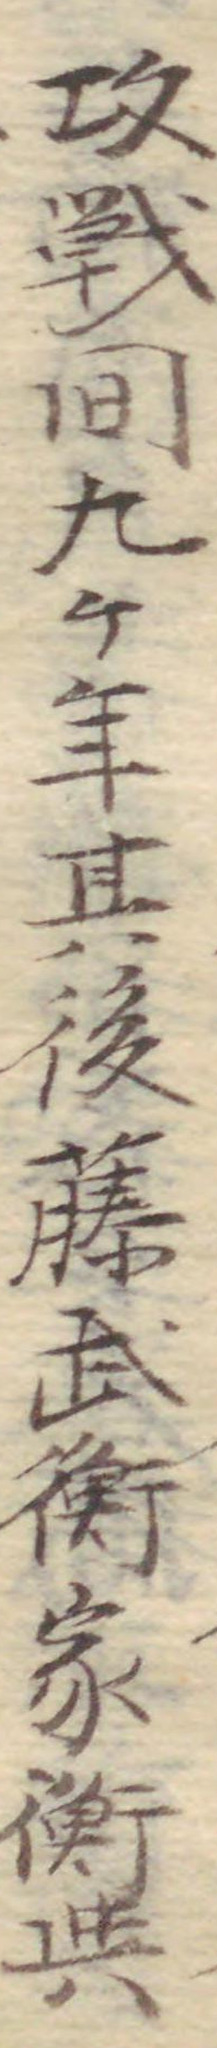攻戦間九ケ年其後藤武衡家衡與
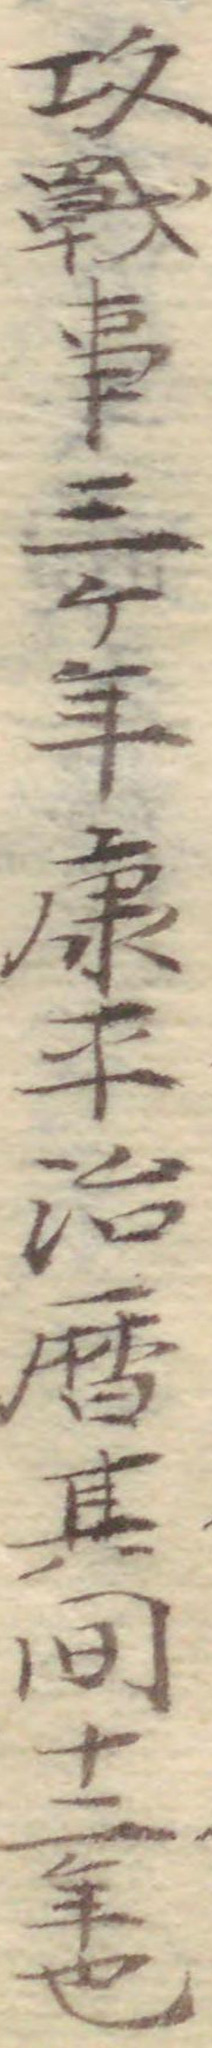攻戦時三ケ年康平治暦其間十二年也
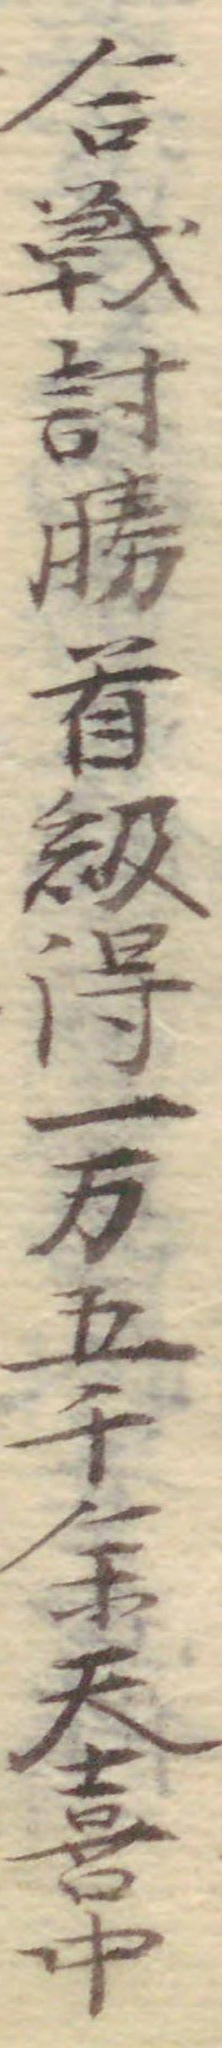合戦討勝首級得一万五千余天喜中
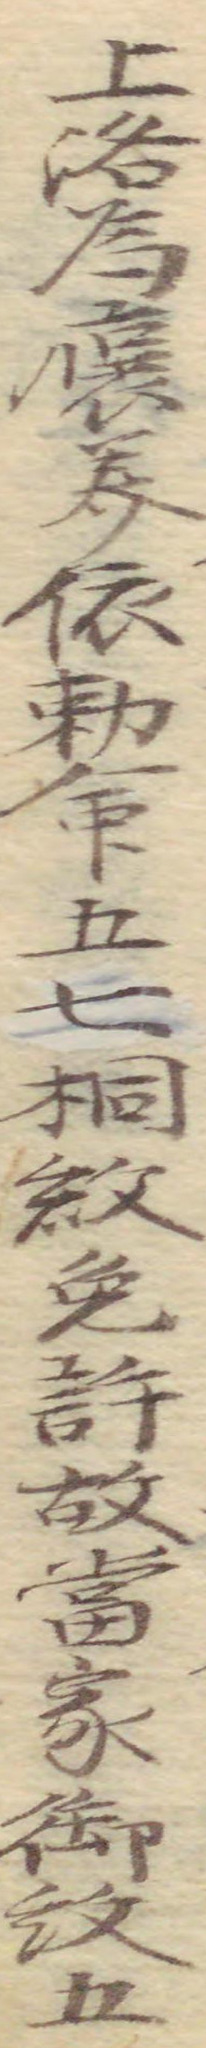上洛為褒美依勅命五七桐紋免許故當家御紋五
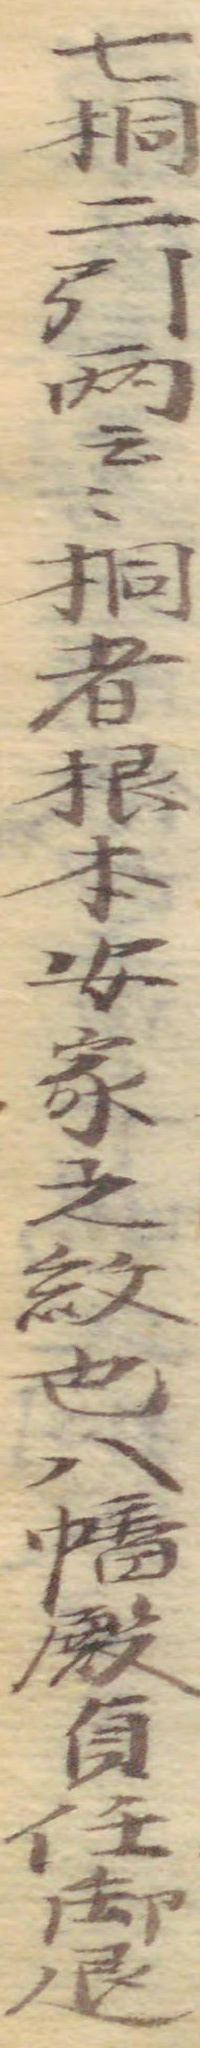七桐ニ引両云々桐者根本安家之紋也八幡殿貞任御退

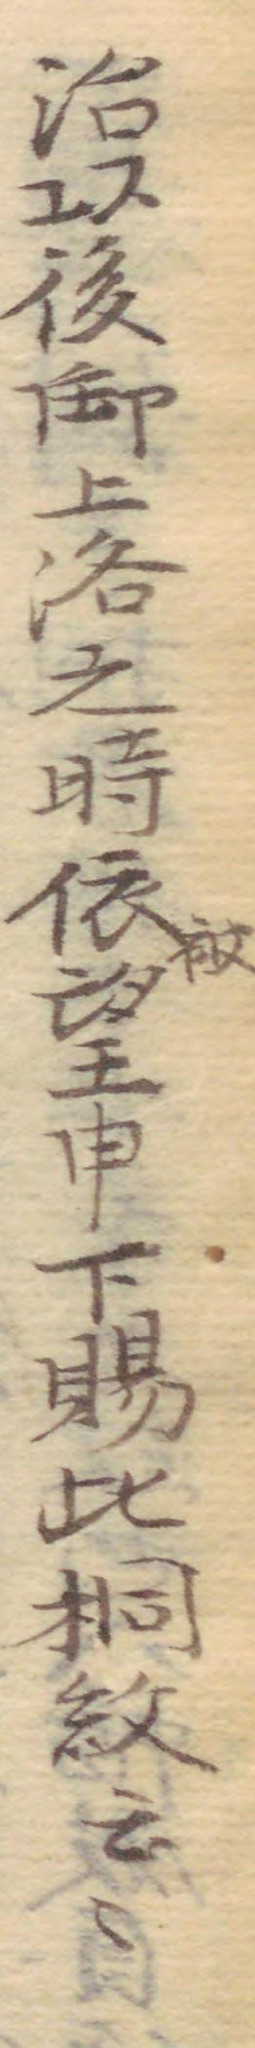治以後御上洛之時依被望申下賜此桐紋云々
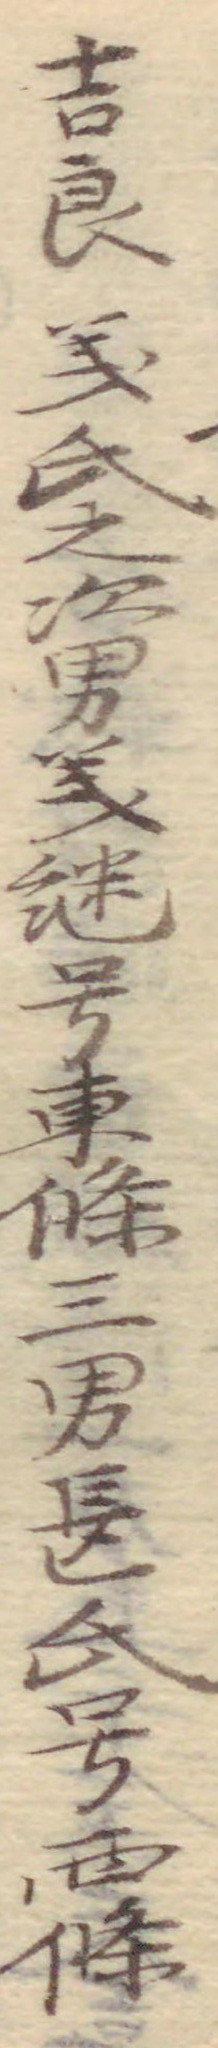吉良義氏之次男義継号東條三男長氏号西條
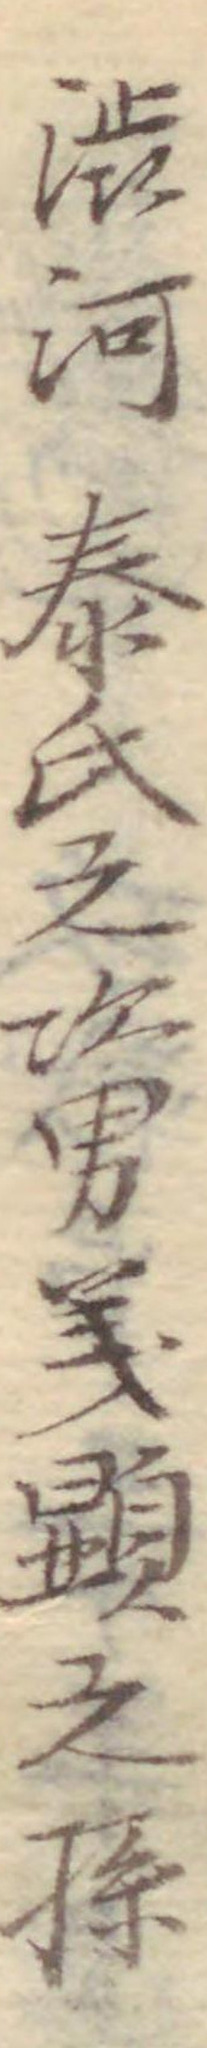渋河泰氏之次男義顕之孫
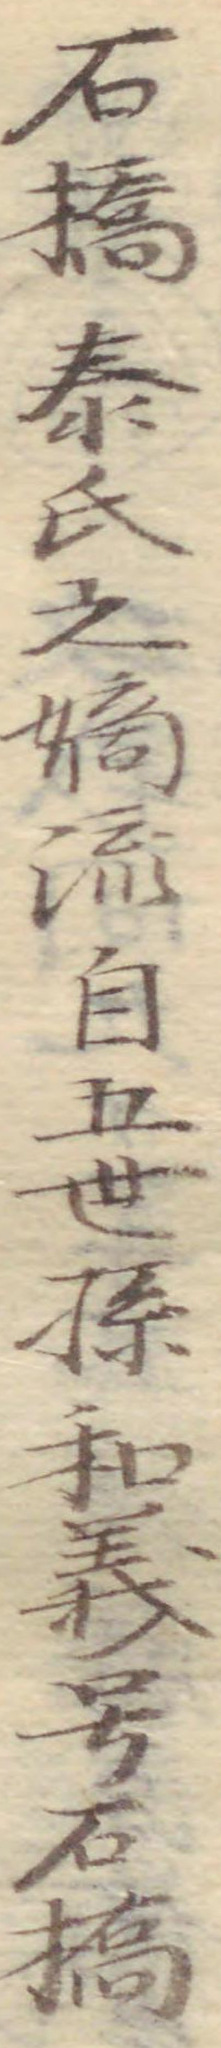石橋泰氏之嫡流自五世孫和義号石橋
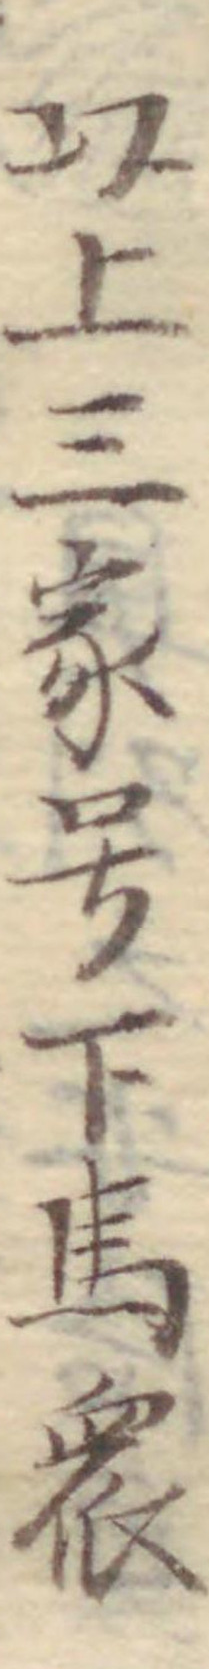以上三家号下馬衆
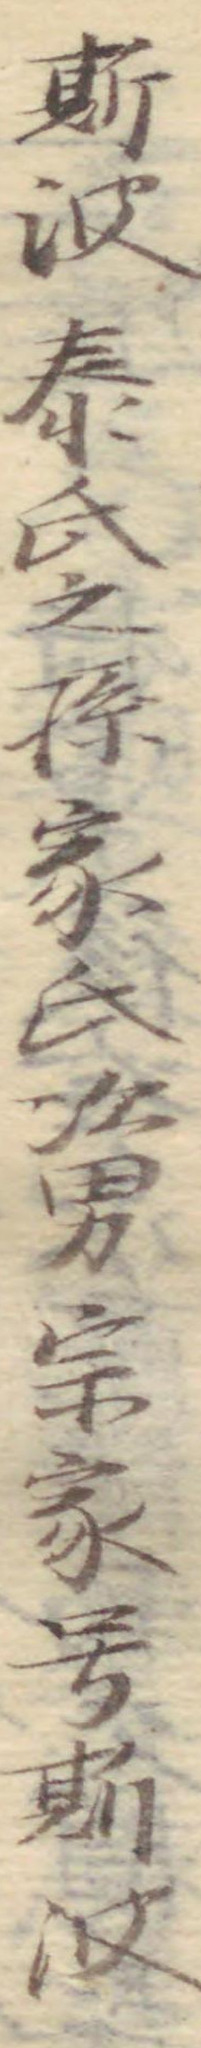斯波泰氏之孫家氏次男宗家号斯波
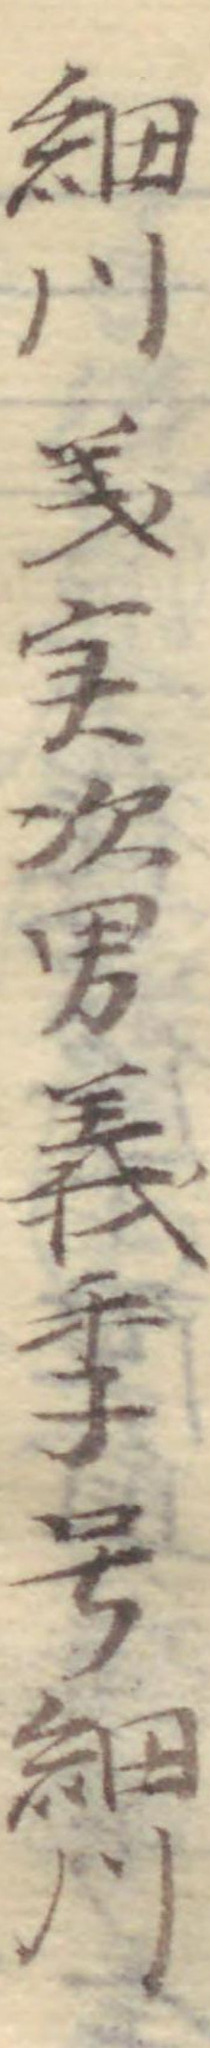細川義実次男義季号細川
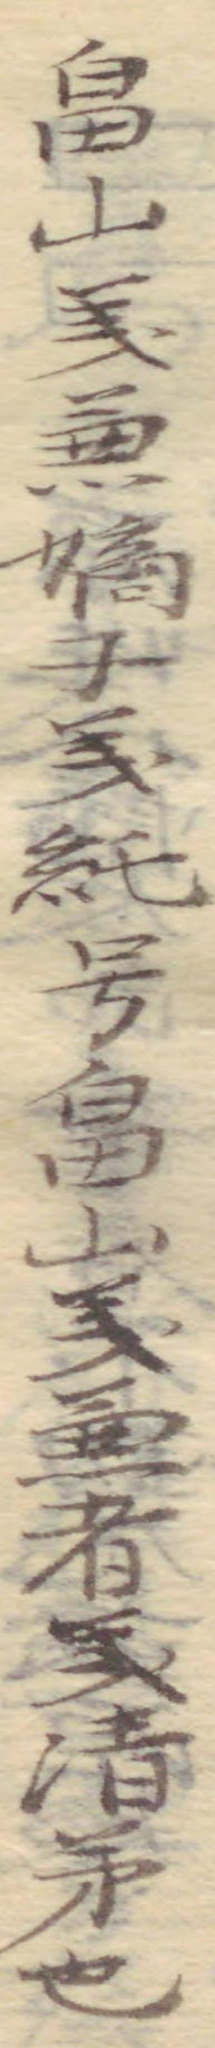畠山義兼嫡子義純号畠山義兼者義清弟也
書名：鶯宿雑記. 巻199-200
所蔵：国立国会図書館 National Diet Library, JAPAN
